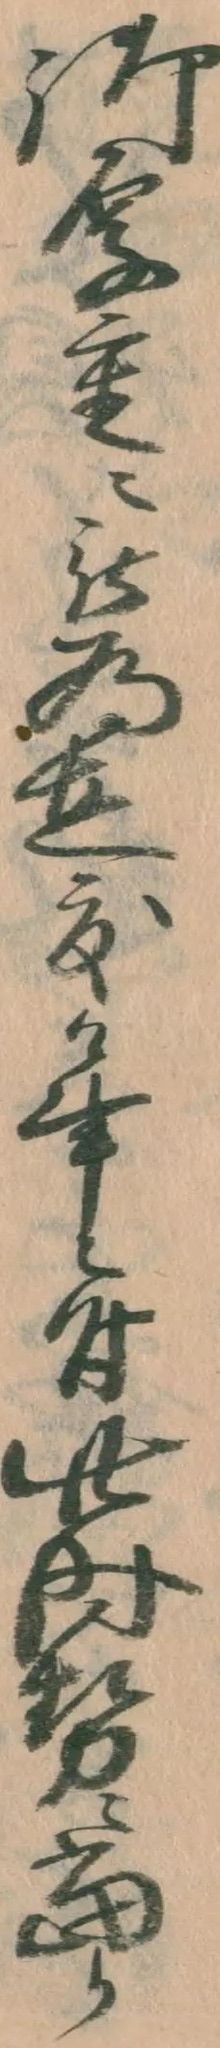御厚重ニ被為立度候事ニ付此時勢二當り
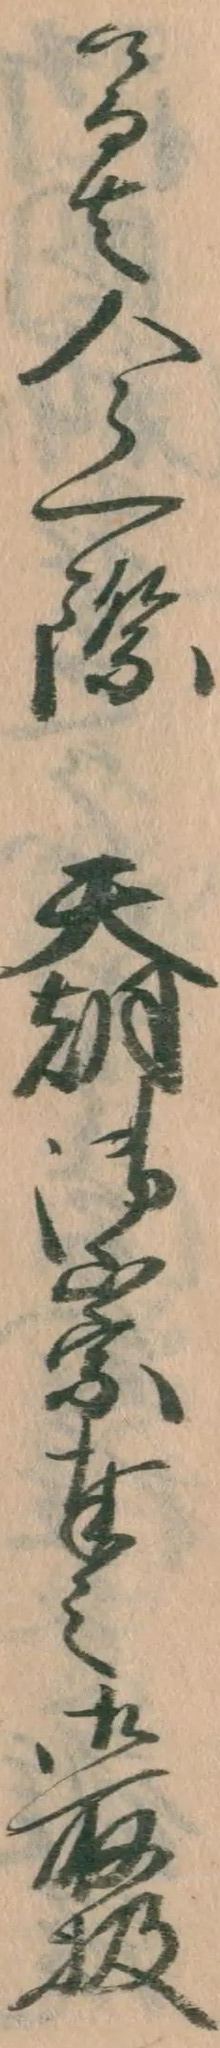候而者今一際天朝御崇奉之御取扱
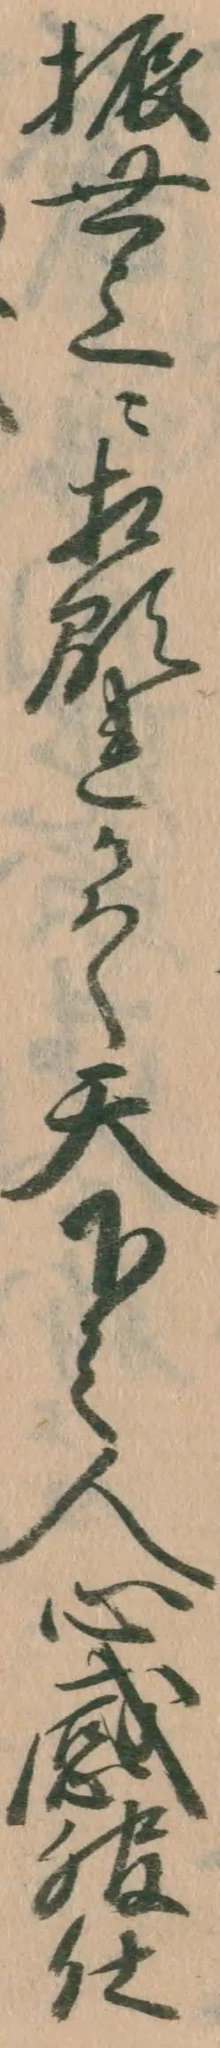振世上ニ相顕れ候ハゝ天下之人心感服仕
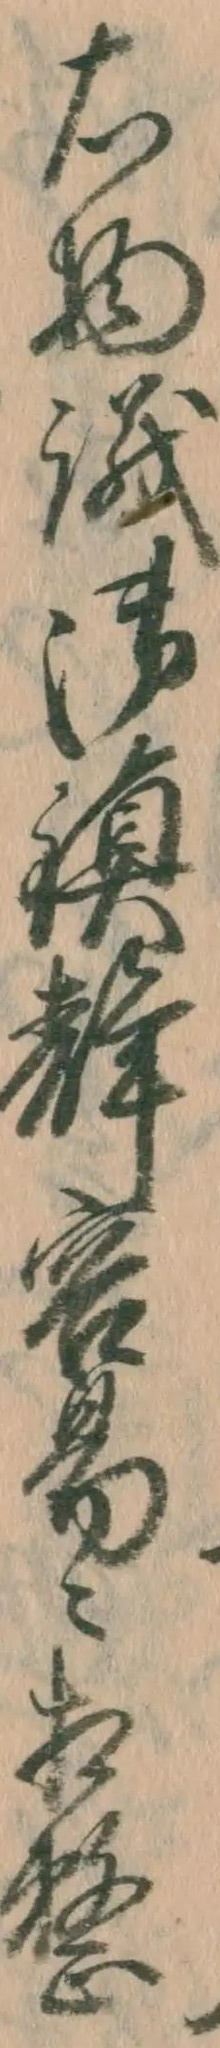右物議御鎮静容易ニ相整
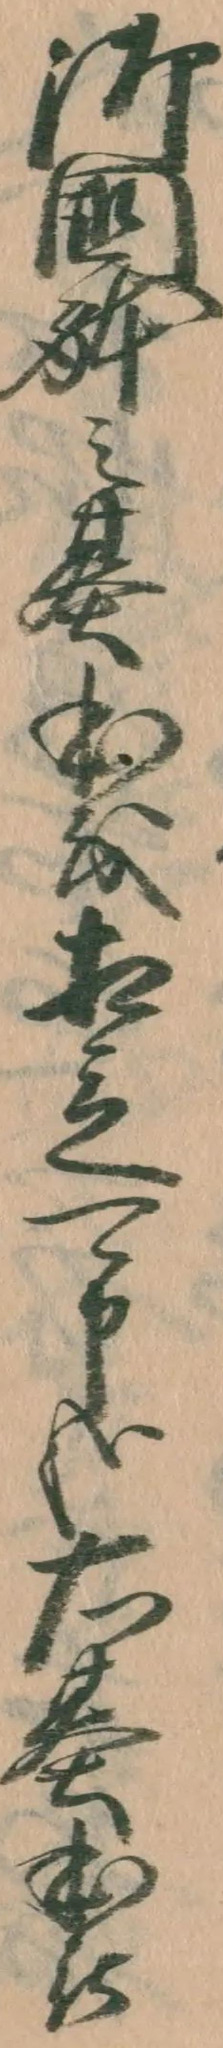御国躰之基本も相立可申哉右基本被
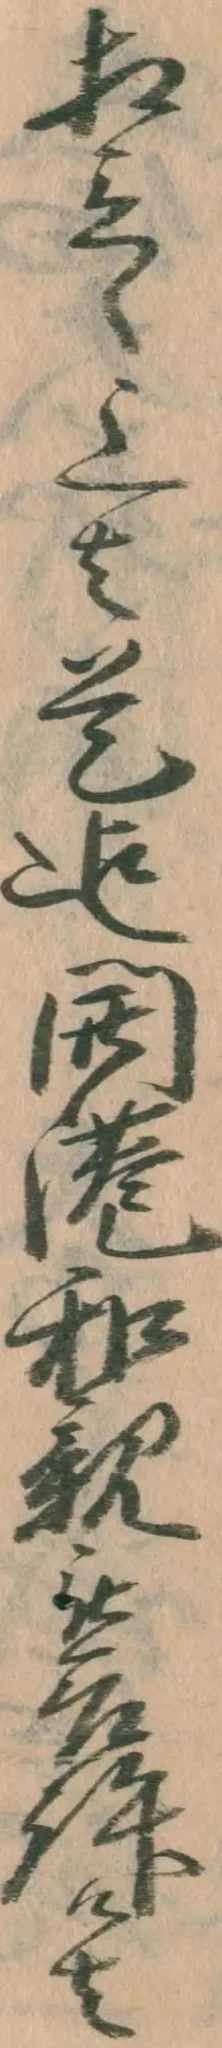相立候上者是迄開港和親被差許候者
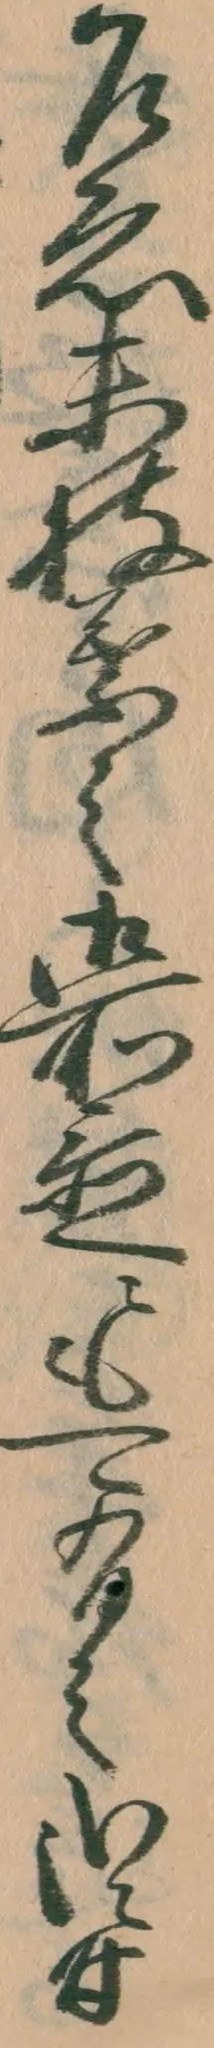乍恐未枝葉之御所置二も可有之哉二付
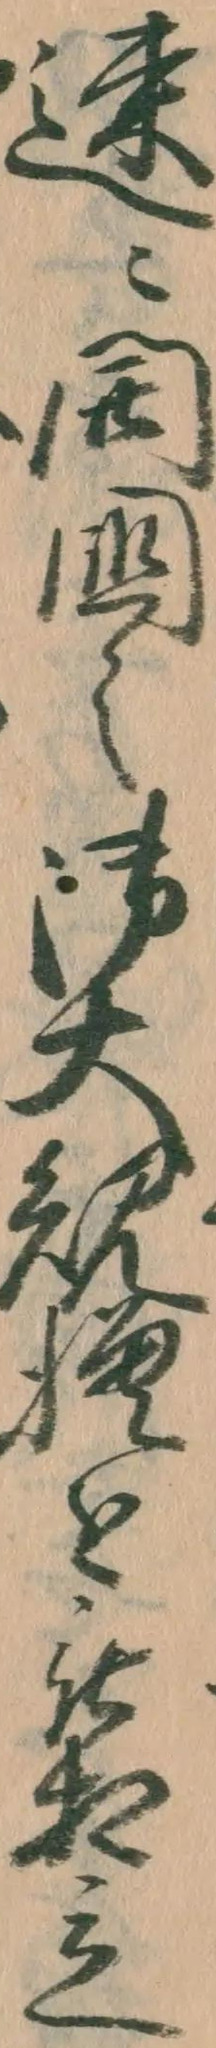速二開国之御大規模を被相立
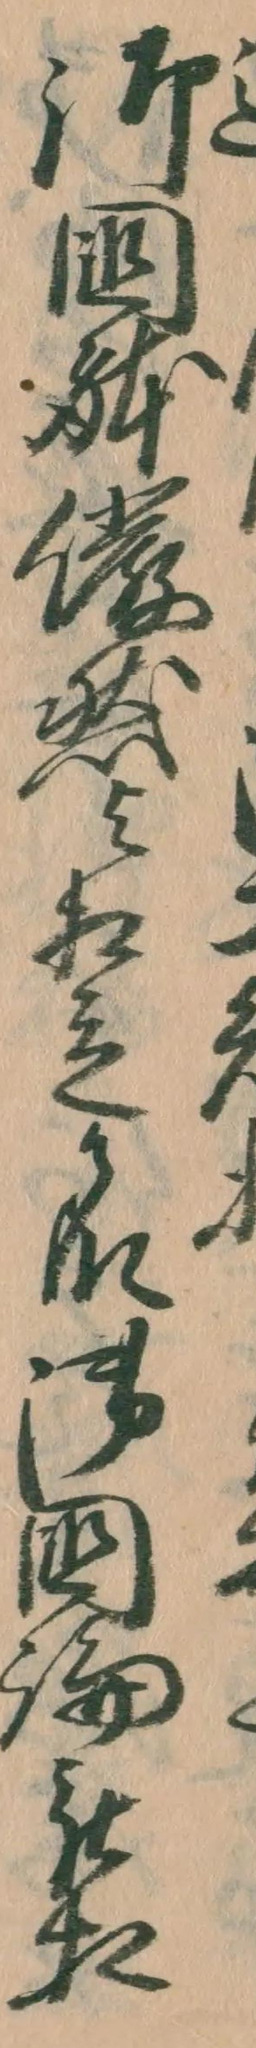御国躰儼然ト相立候段御国論被相
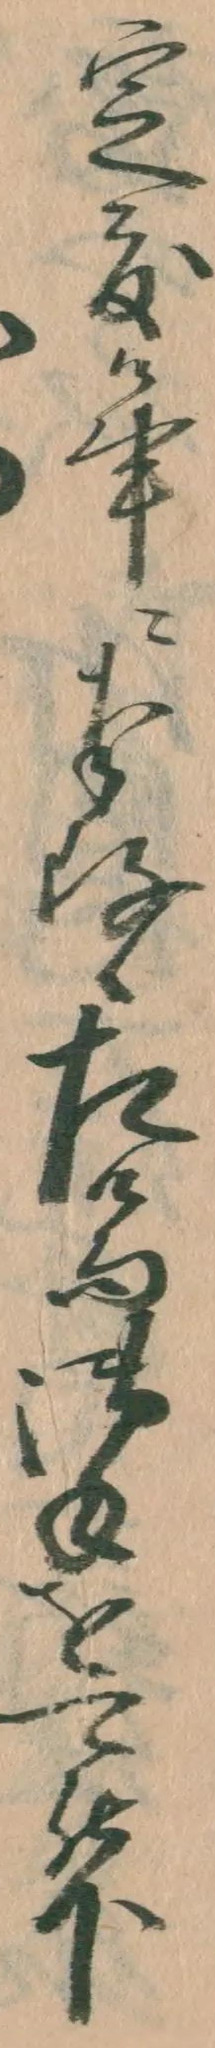定度候事二奉存候左候而御手を可被下
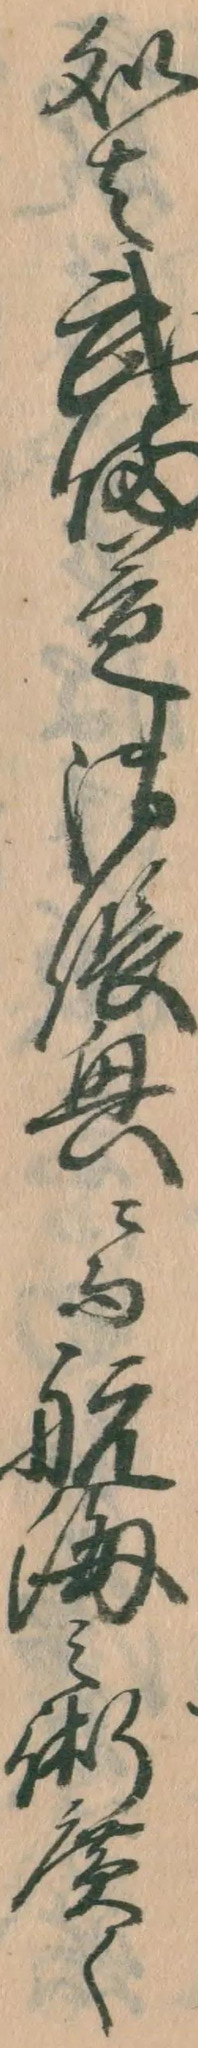処者武備益御張興二而航海之術廣く
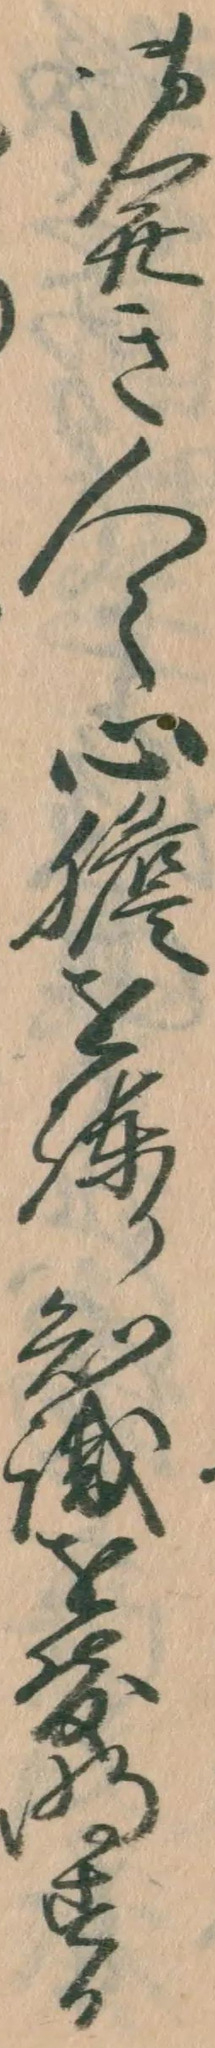御開き人々心譫を練り知識を発明する
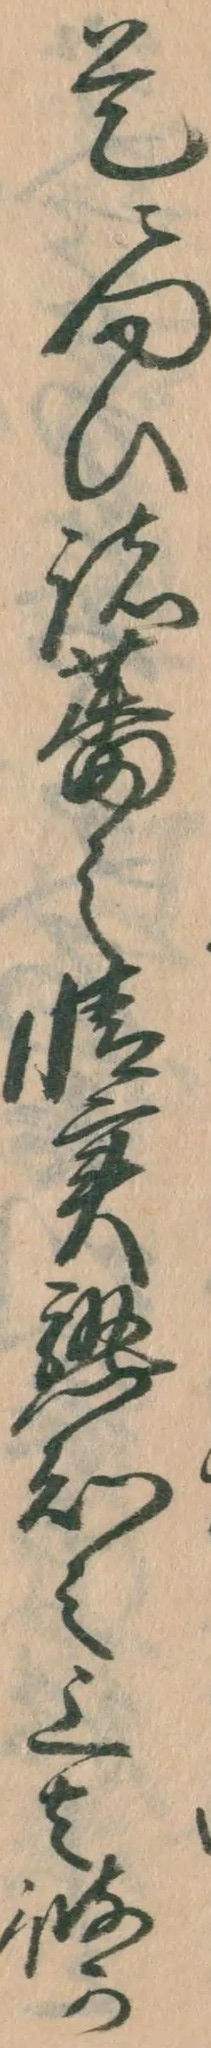是二向ひ諸蕃之情実熟知之上者彼か
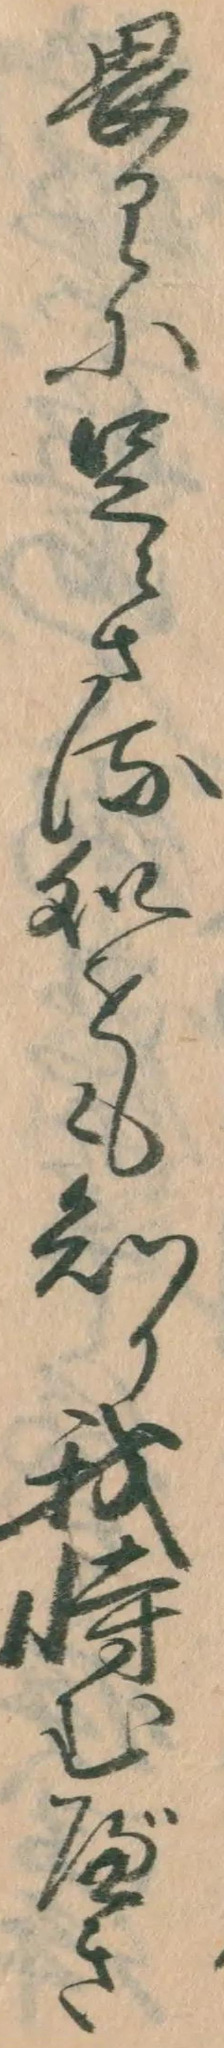畏るゝに足らさる処をも知り我恃むべき
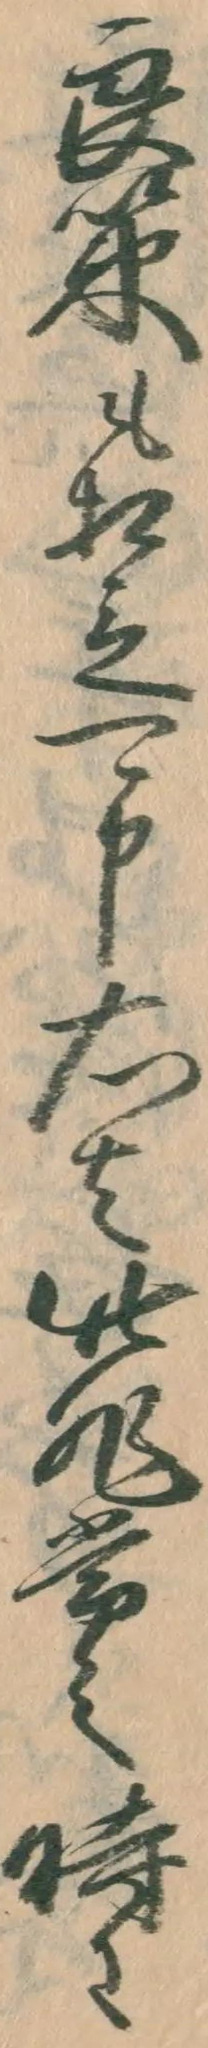良策も相立可申右者此非常之時に
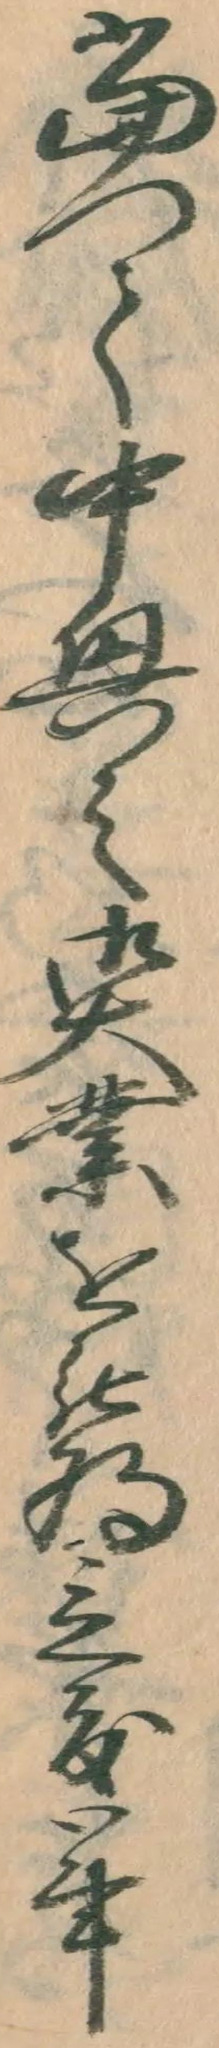當つて中興之御大業を被為立度御事
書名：麗斎叢書. 20
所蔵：国立国会図書館 National Diet Library, JAPAN
